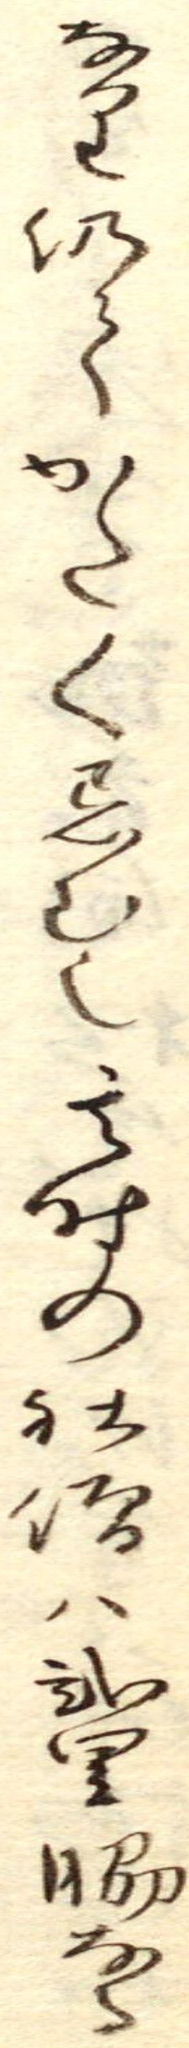なり仍てかたく忌む也其時の社僧は弐里脇なる
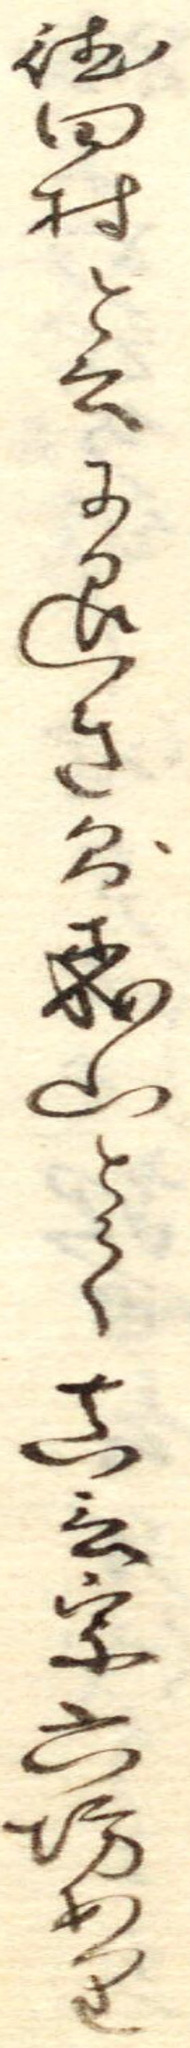徳田村と云に退き則森山とて真言宗六坊あり
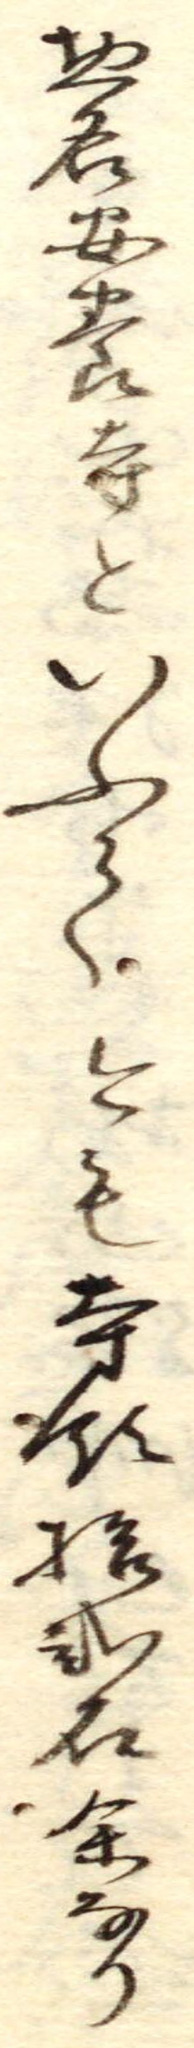惣名安養寺といふて今も寺領拾弐石余なり
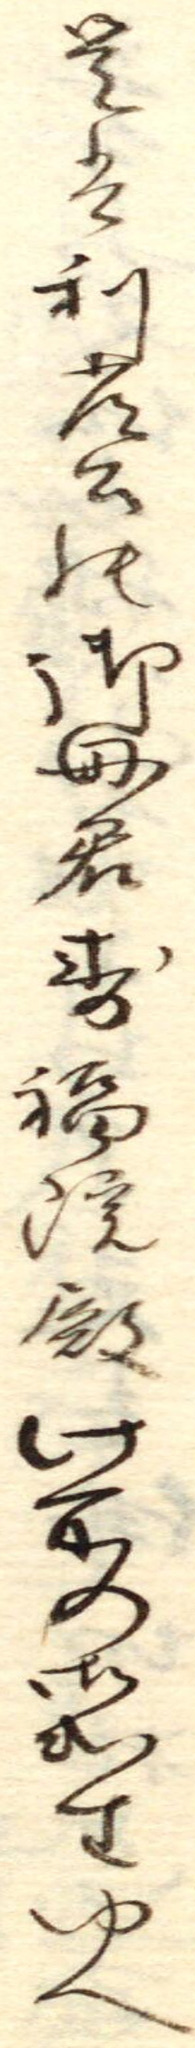是は利常公の御母君寿福院殿此所の御出生ゆへ
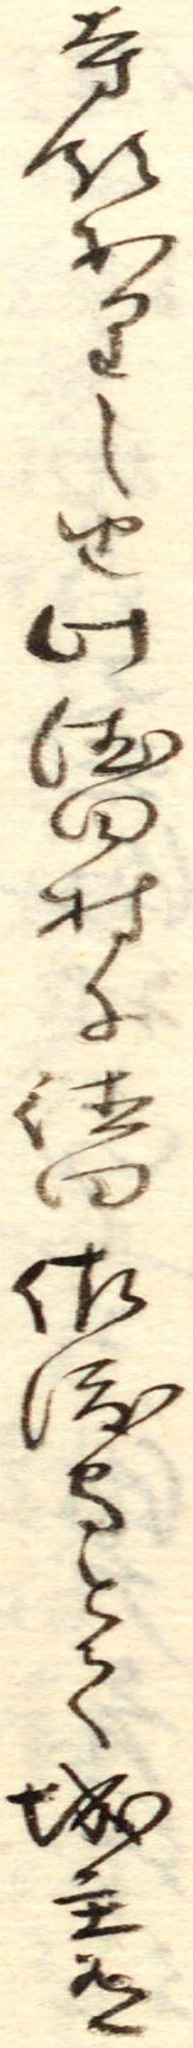寺領ありし由此徳田村に徳田佐渡守とて城主有
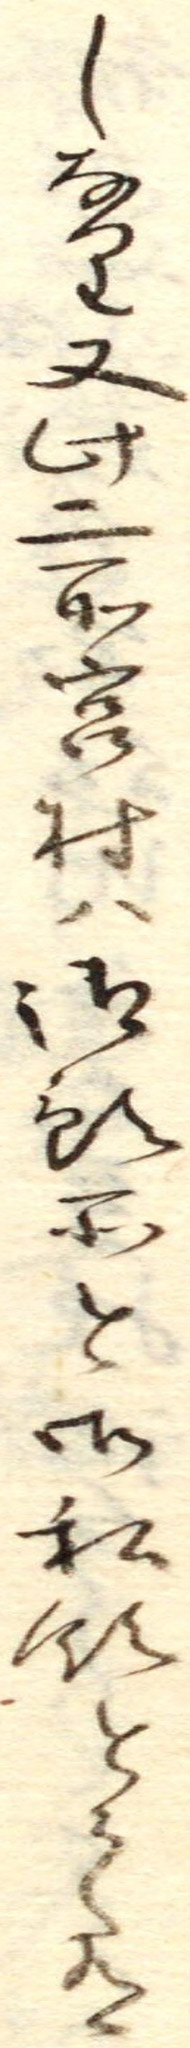しなり又此二所宮村は御預所と御私領とて有
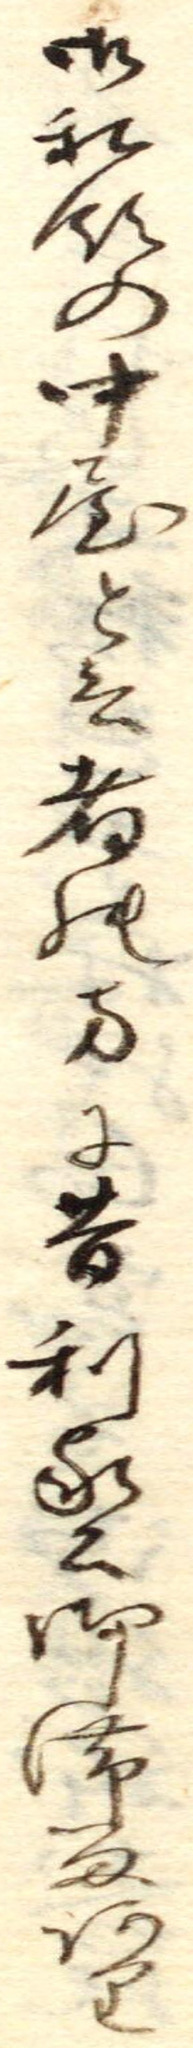御私領の中屋と云者の方に昔利家公御滞留あり
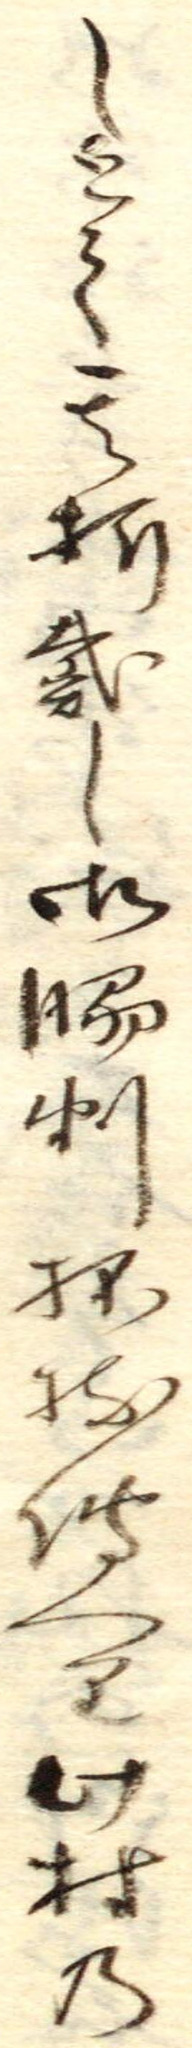しとて其折戴し御脇刺抔伝へり此村の
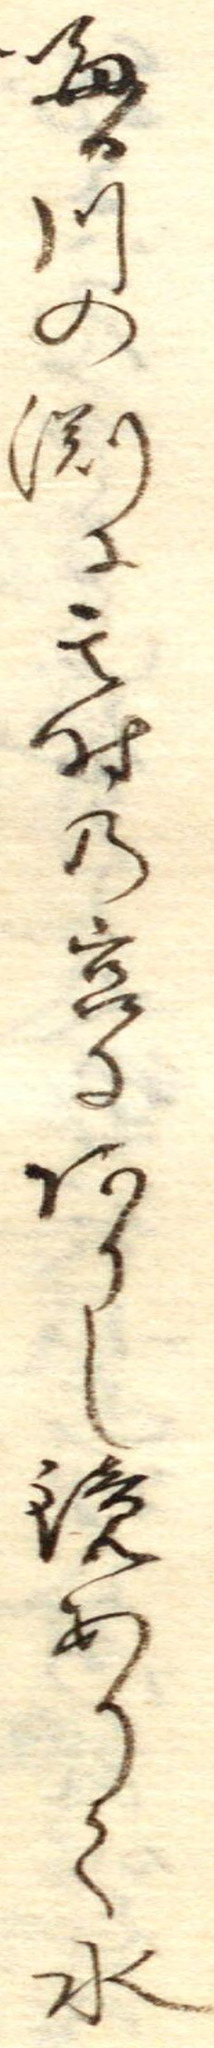晦日川の淵に其時の宮にありし鏡ありて水

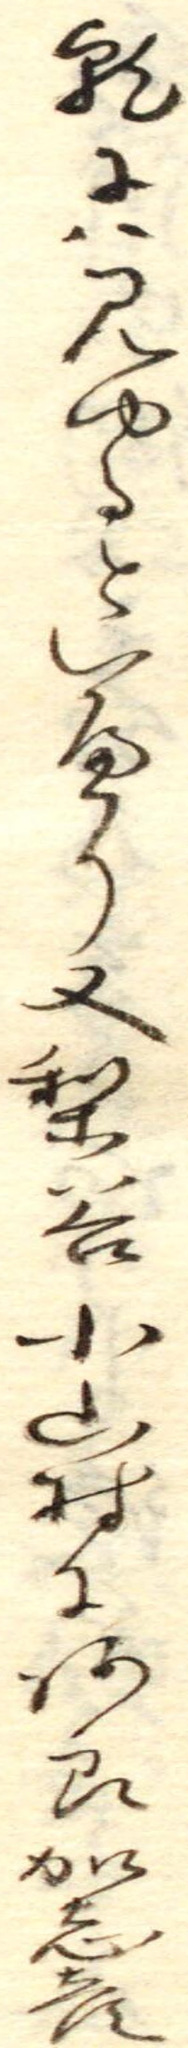就には見ゆるといへり又梨谷小山村に阿良加志彦
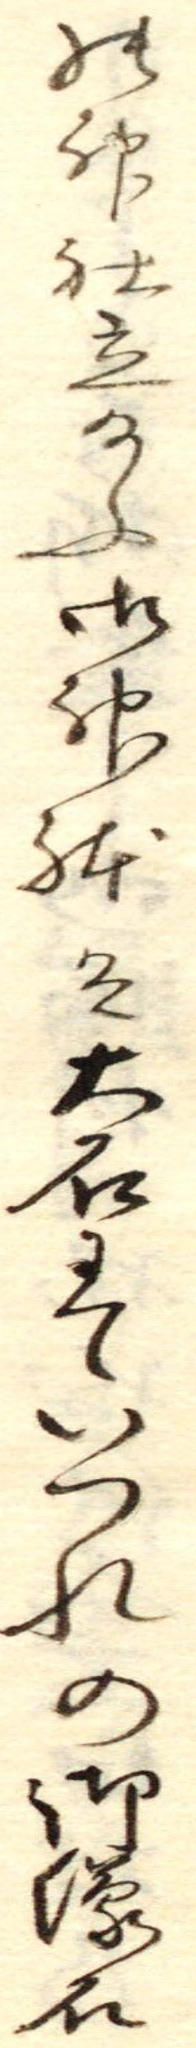の神社立給ふ御神躰は大石にていつれの御像石
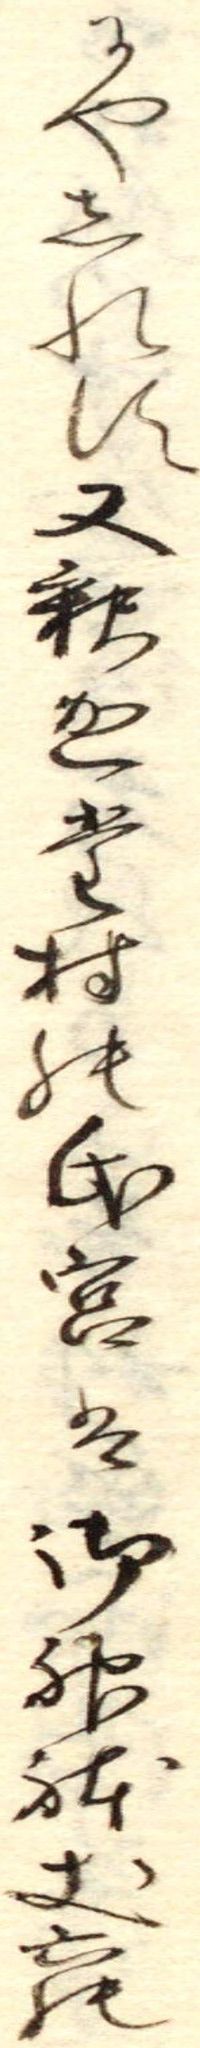にやしれす又釈迦堂村の氏宮は御神躰丈六の
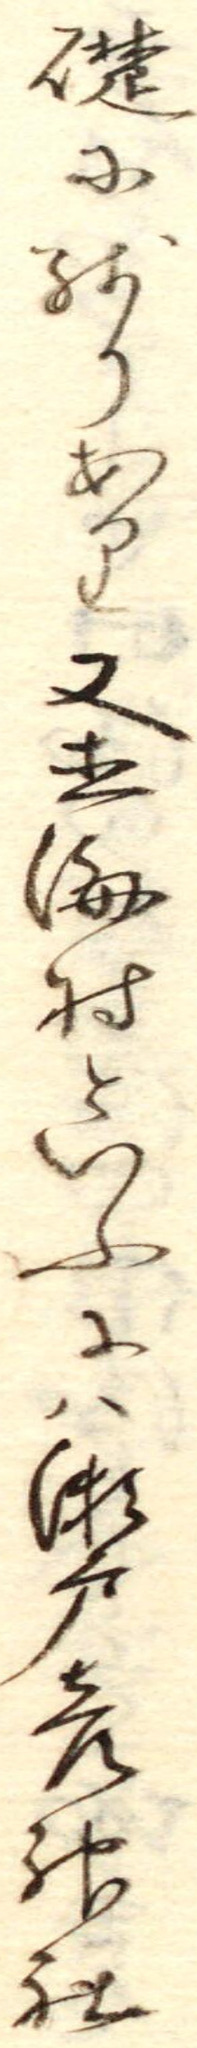礎に残りあり又直海村といふには瀬戸彦神社
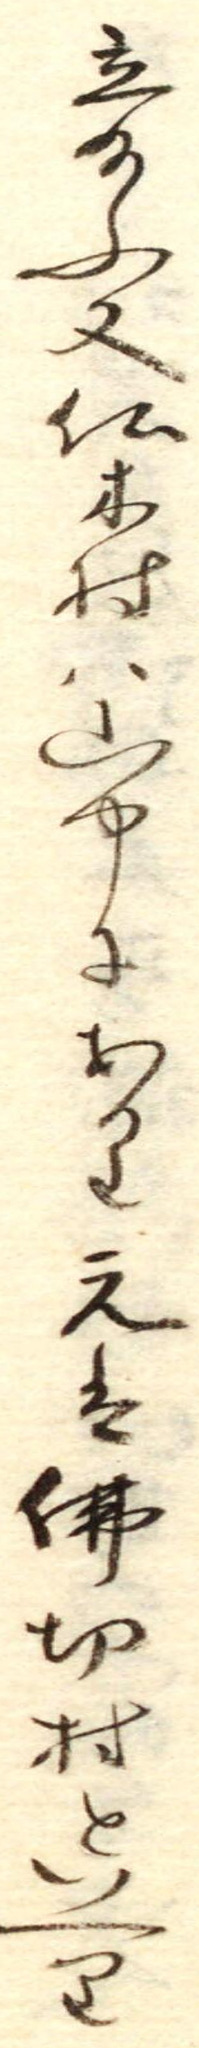立給ふ又仏木村は山中にあり元は仏切村といへり
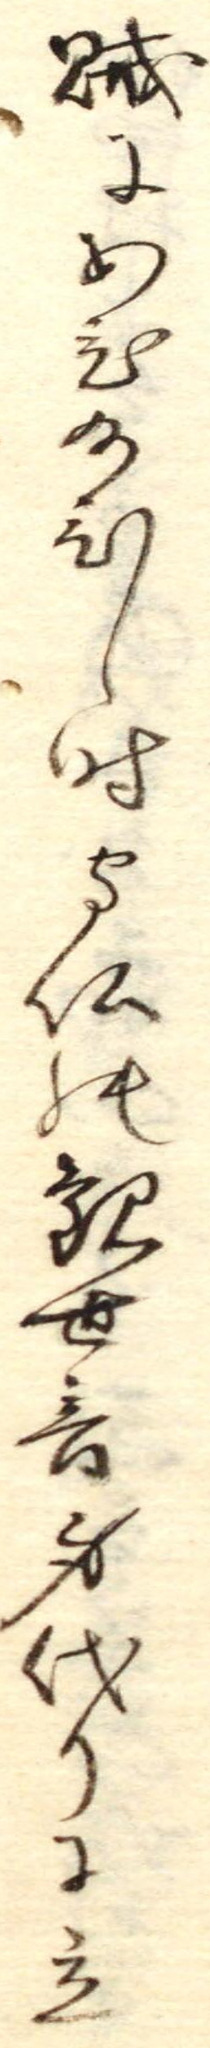賊にあひ給ひし時寺仏の観世音身代わりに立
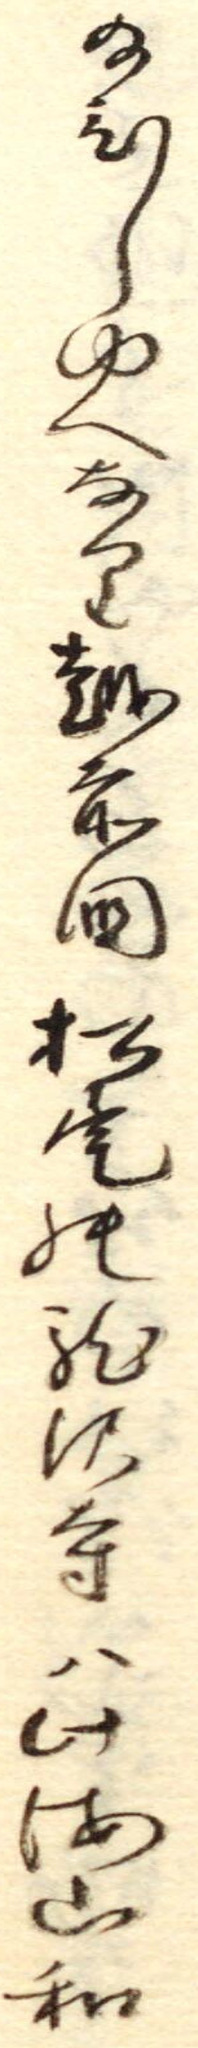給ひしゆへなり越前国松尾の龍沢寺は此梅山和
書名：能登名跡誌
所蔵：Ishikawa Prefectural Library
